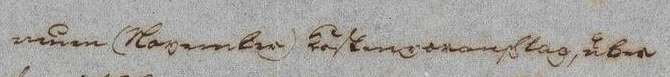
neuen (November) Kostenvoranschlag, über
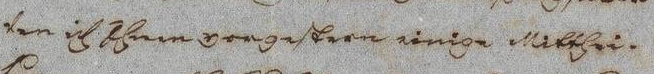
den ich Ihnen vorgestern einige Mitthei-
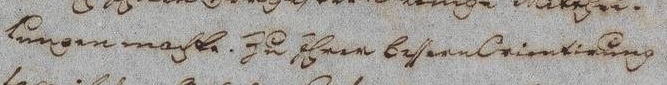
lungen machte. Zu ihrer bessern Orientirung
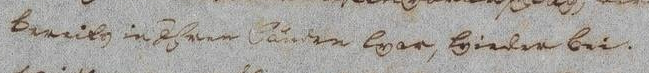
bereits in Ihren Händen war, wieder bei.
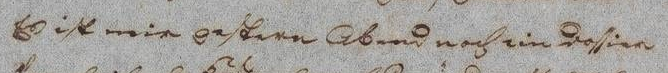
Es ist mir gestern Abend noch ein Dossier
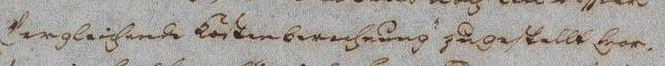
«Vergleichende Kostenberechnung» zugestellt wor-
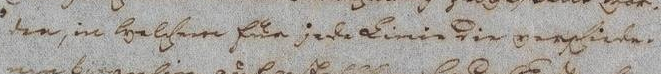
den, in welchem für jede Linie die verschiede-
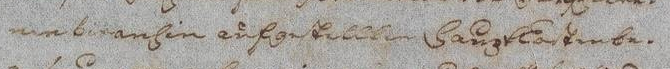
nen bis anhin aufgestellten Hauptkostenbe-
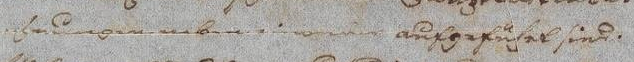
rechnungen nebeneinander aufgeführt sind.
